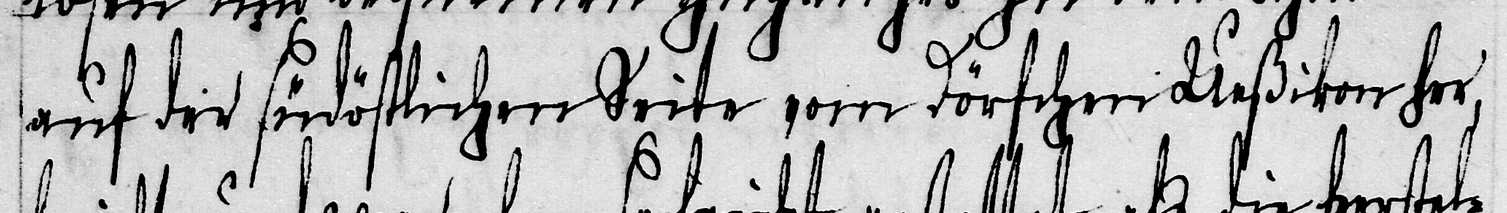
auf der südöstlichen Seite vom Dörfchen Ueßikon her,
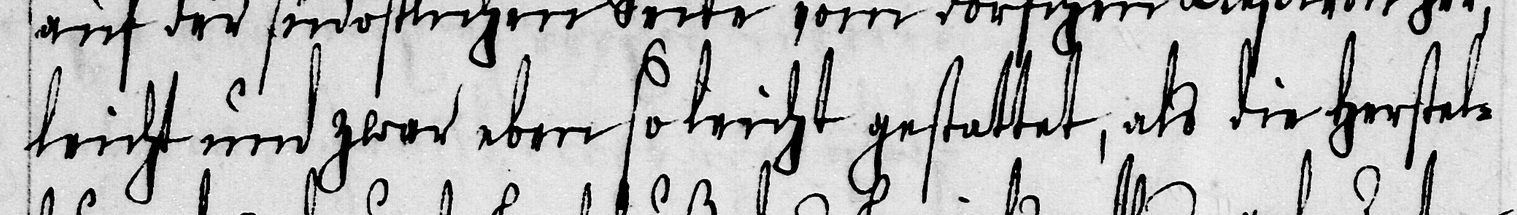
leicht und zwar eben so leicht gestattet, als die Her¬
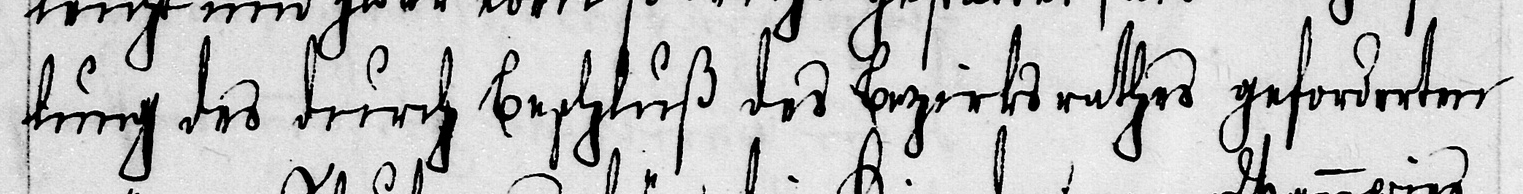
lung des durch Beschluß des Bezirksrathes geforderten
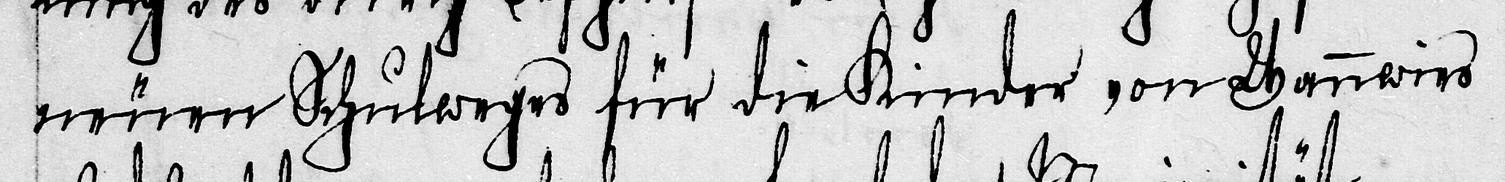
neuen Schulweges für die Kinder von Wannwies
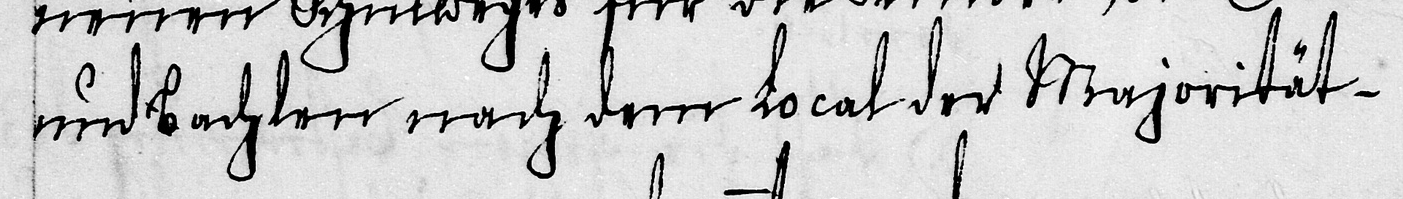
und Bachlen nach dem Local der Majorität –
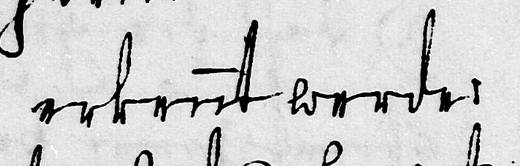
erkennt werde:
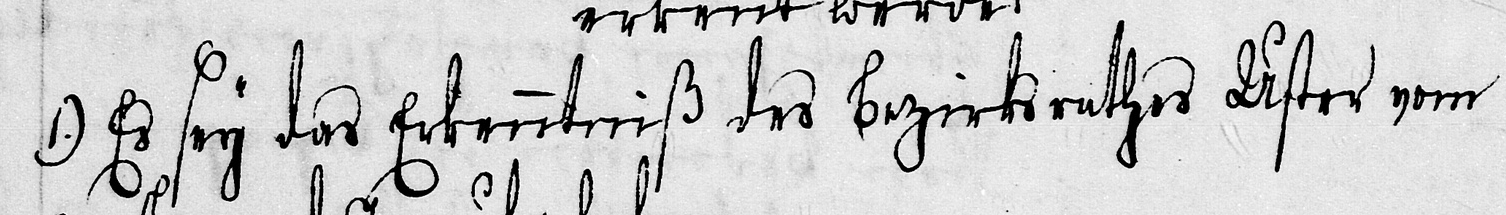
1.) Es sey das Erkenntniß des Bezirksrathes Uster vom
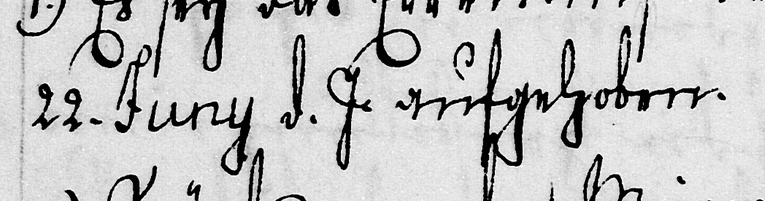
22. Juny d. J. aufgehoben.
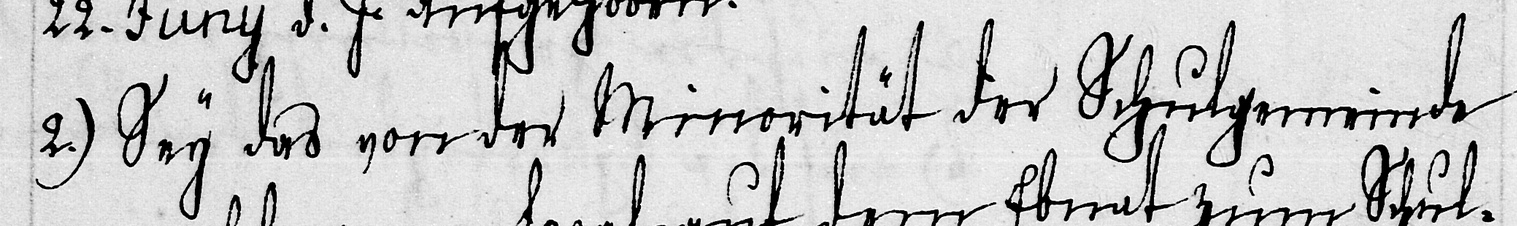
2.) Sey das von der Minorität der Schulgemeinde
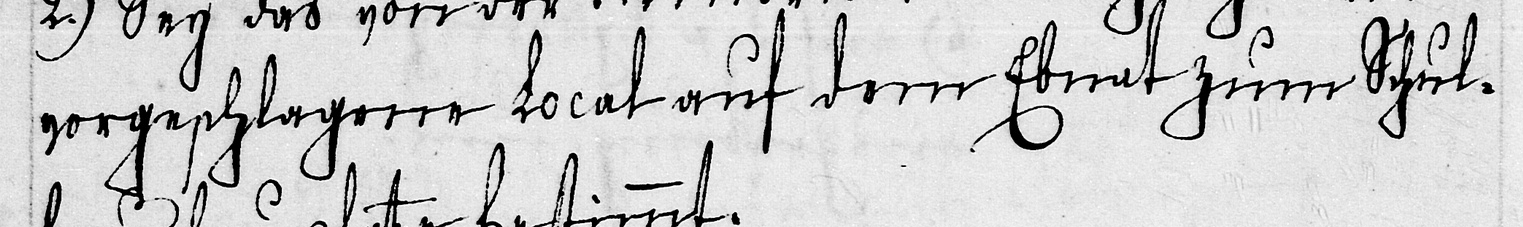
vorgeschlagene Local auf dem Ebnat zum Schul¬
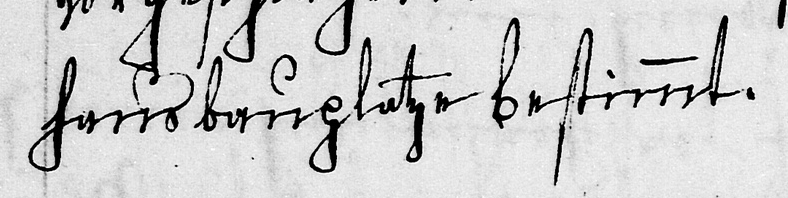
hausbauplatze bestimmt.
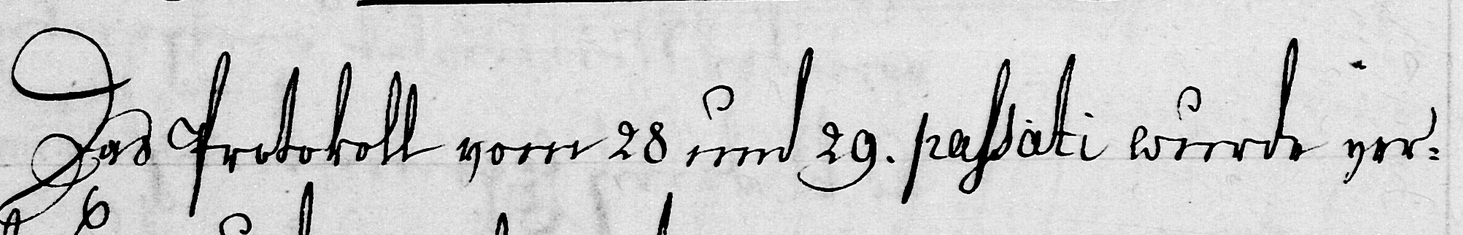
Das Protokoll vom 28 und 29. passati wurde ver¬
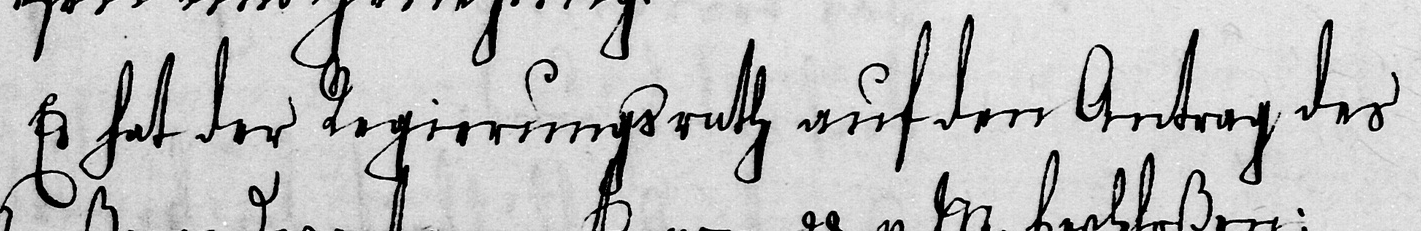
Es hat der Regierungsrath auf den Antrag des
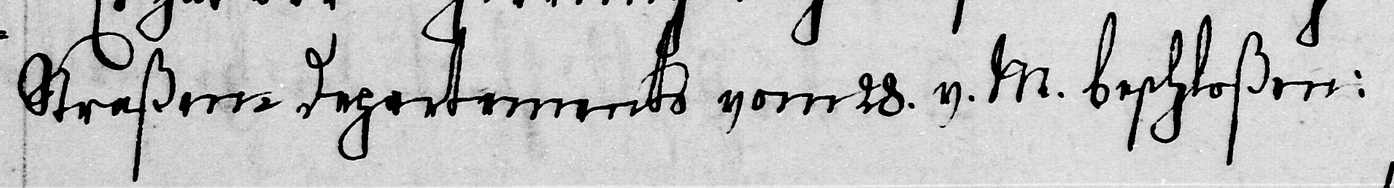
Straßen-Departements vom 28. v. M. beschloßen:
